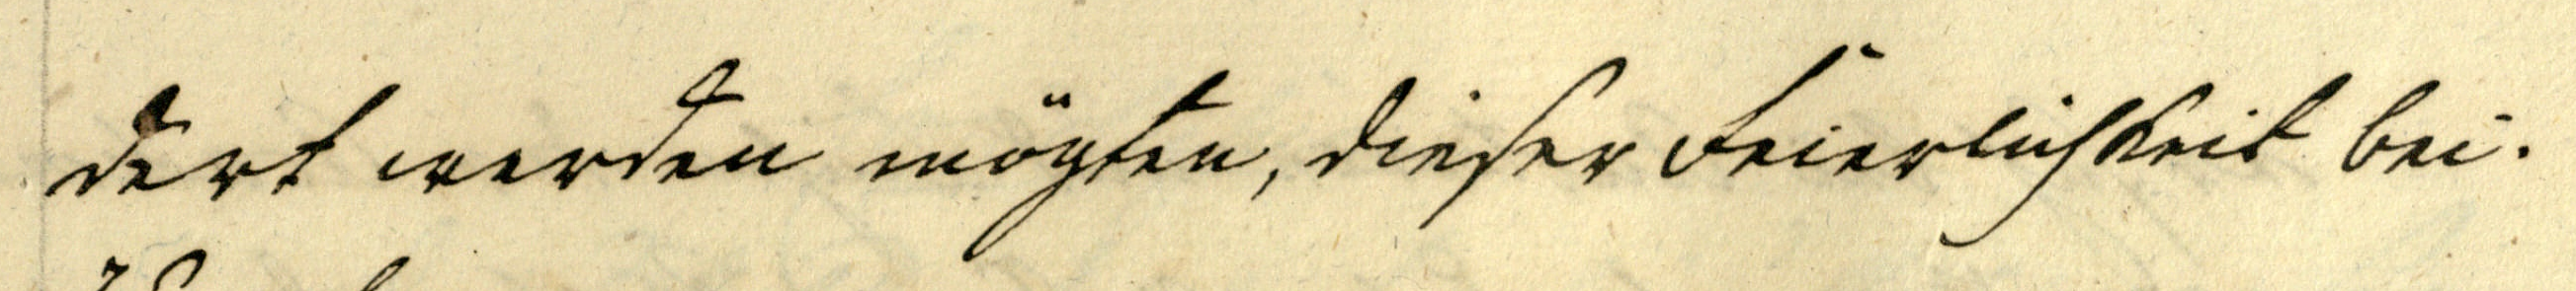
dert werden mögten, dieser Feierlichkeit bei¬
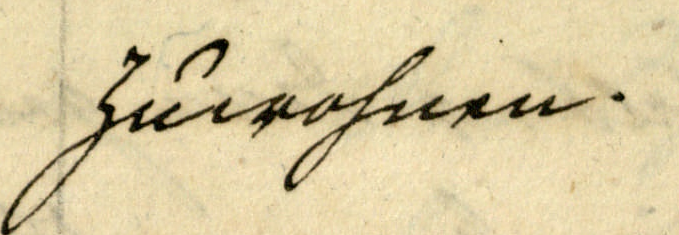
zuwohnen.
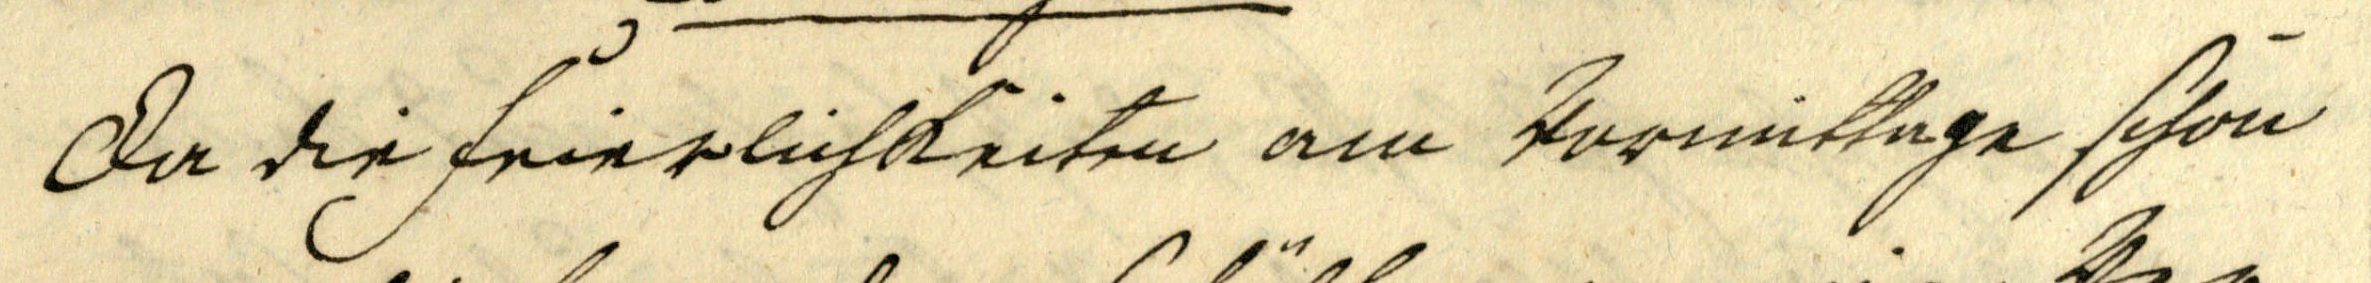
Da die Feierlichkeiten am Vormittage schon
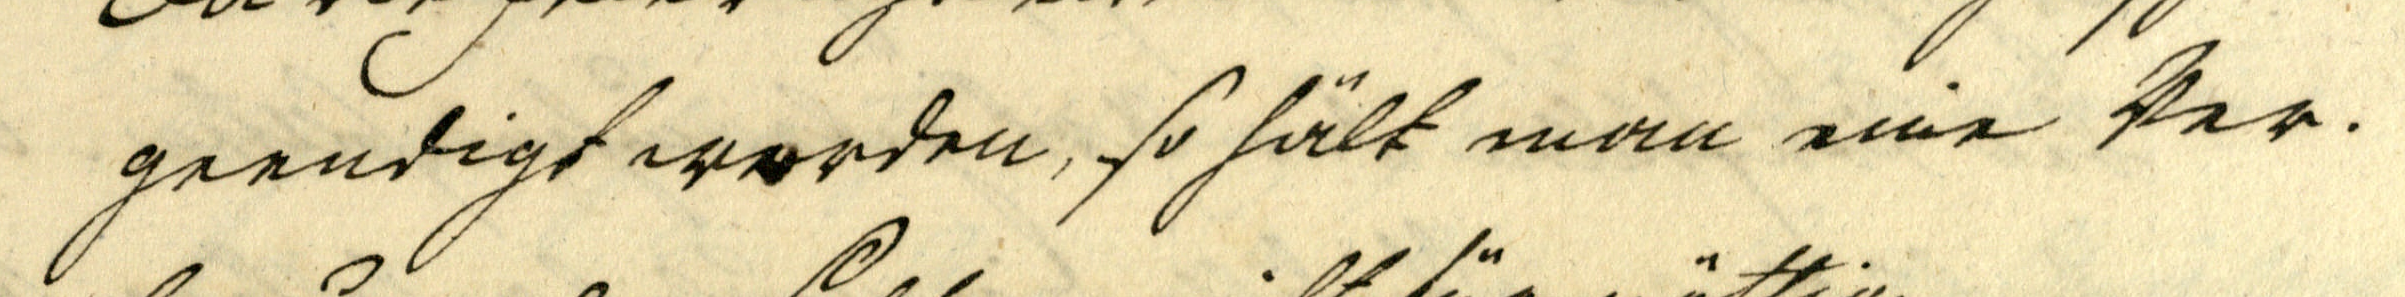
geendigt werden, so hält man eine Ver¬
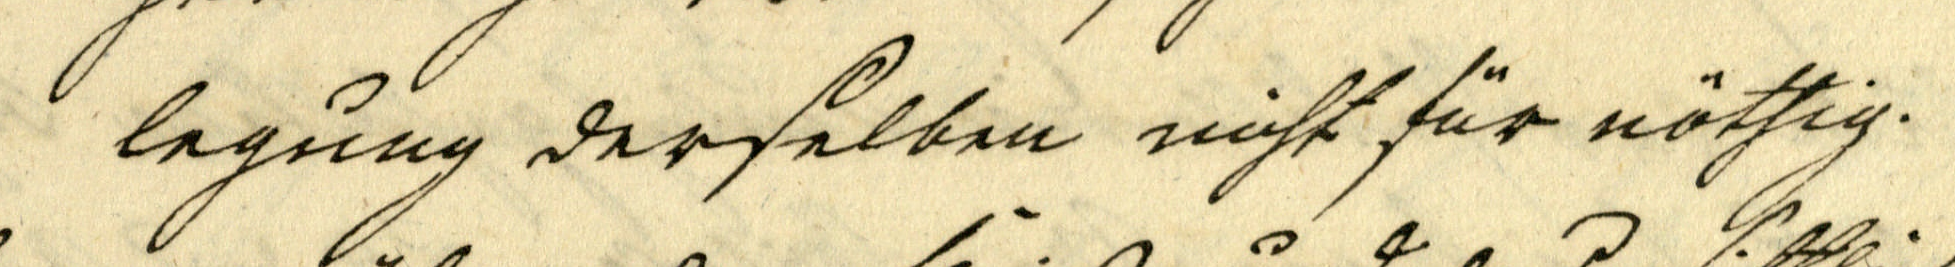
legung derselben nicht für nöthig.
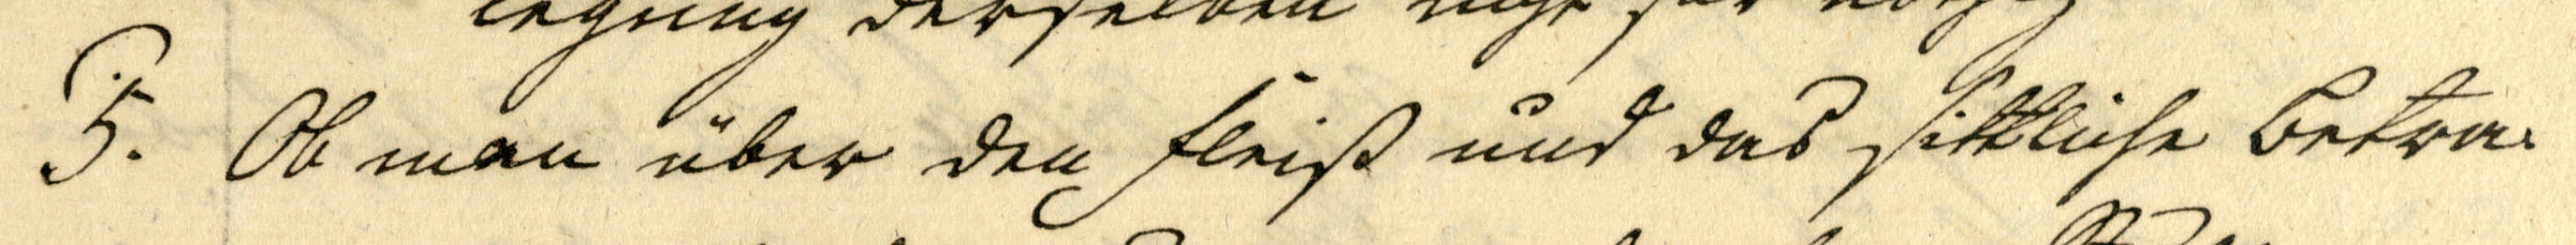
5. Ob man über den Fleiß und das sittliche Betra¬
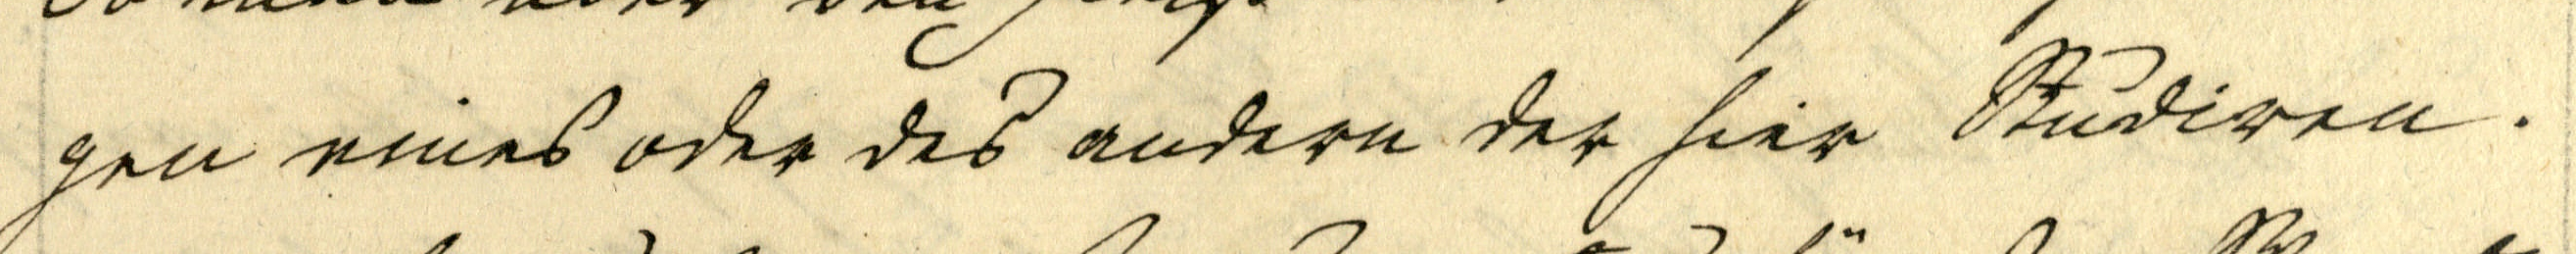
gen eines oder des andern der hier Studiren¬
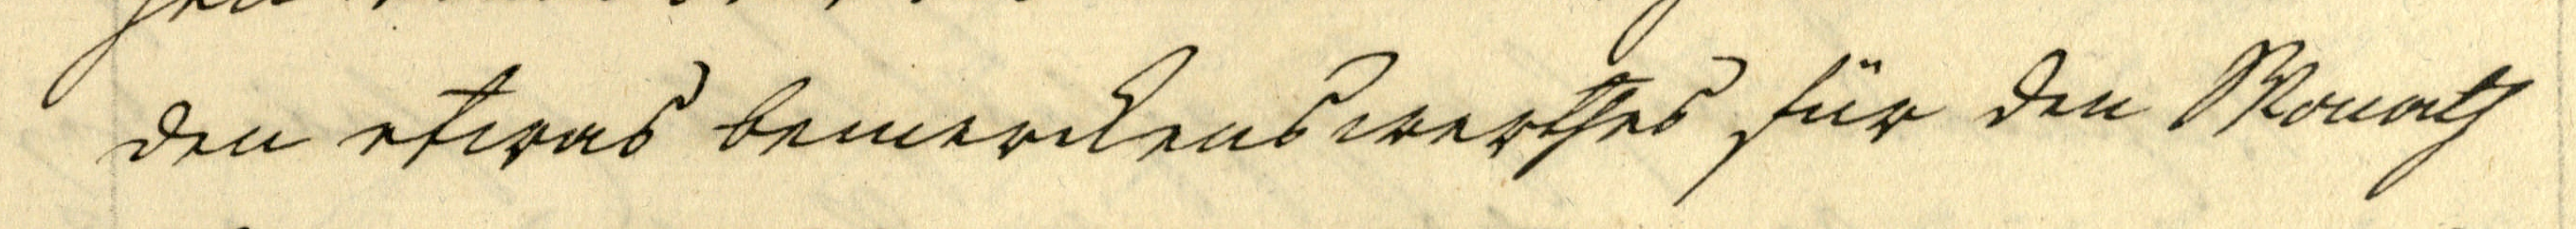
den etwas bemerckens werthes für den Monath
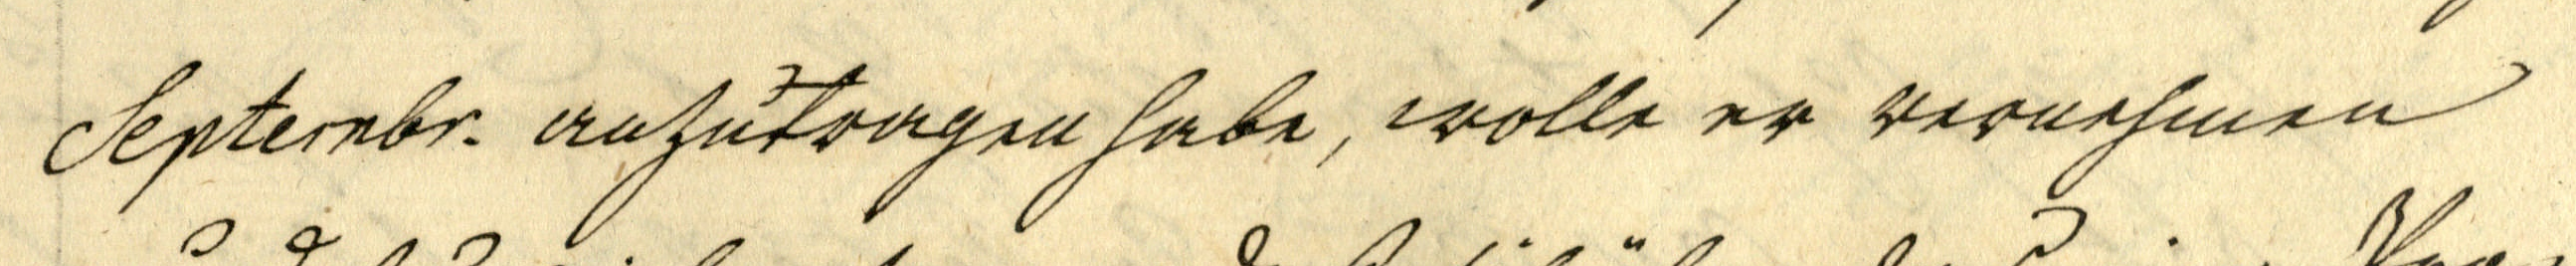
Septembr. anzufragen habe, wolle er vernehmen
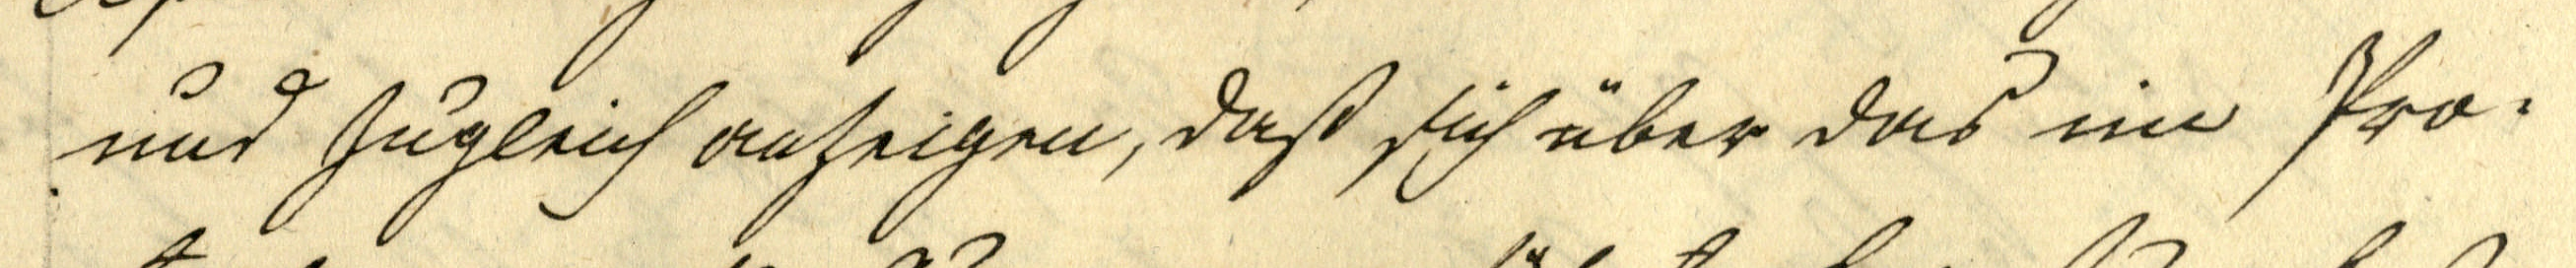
und zugleich anzeigen, daß sich über das im Pro¬
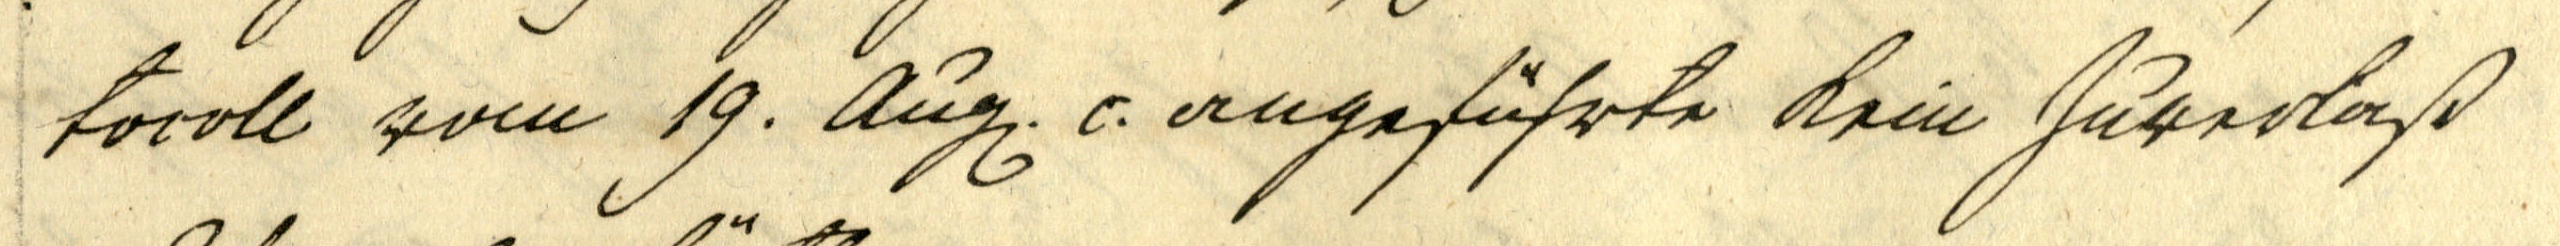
tocoll vom 19. Aug. c. angeführte kein Zuverlaß
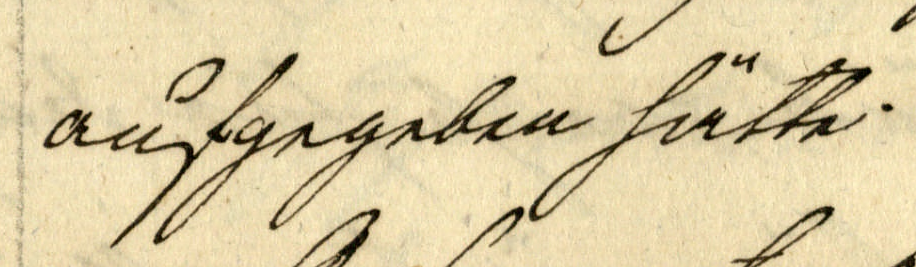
aufgegeben hätte.
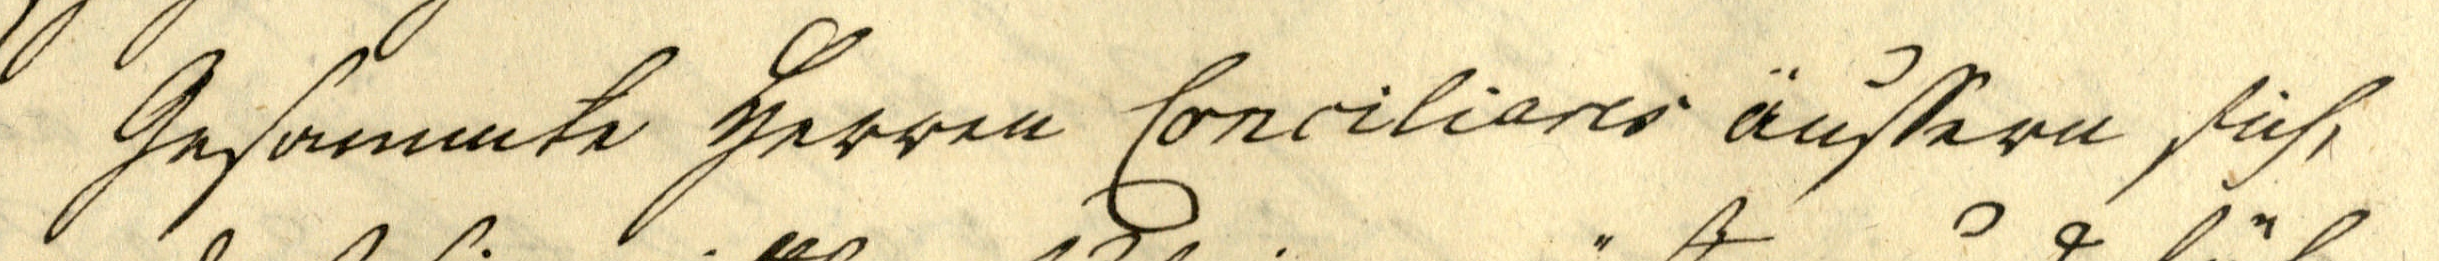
Gesammte Herren Conciliares äussern sich,
